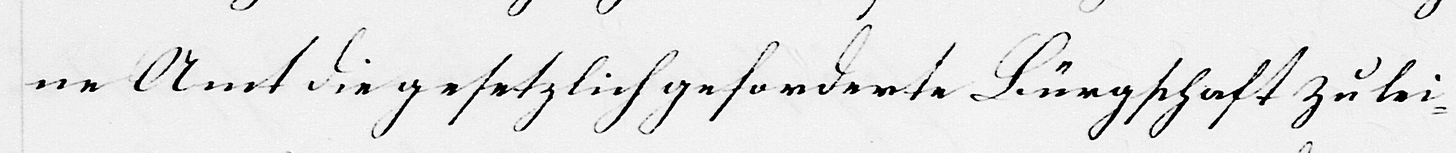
ne Amt die gesetzlich geforderte Bürgschaft zu lei¬
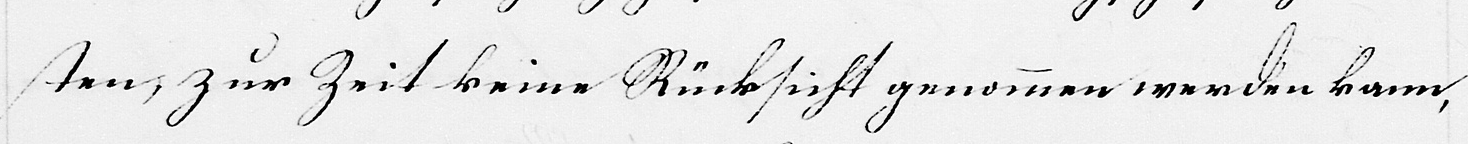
sten, zur Zeit keine Rücksicht genommen werden kann,
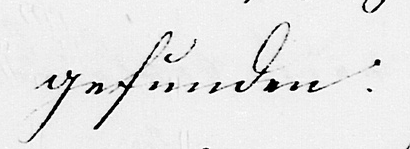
gefunden:
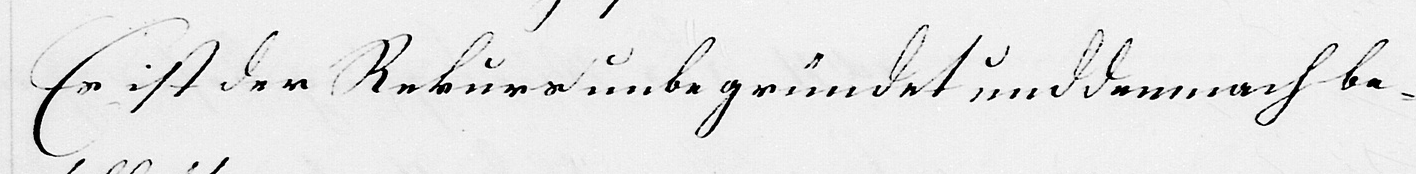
Es ist der Rekurs unbegründet und demnach be¬
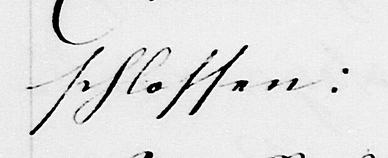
schlossen:
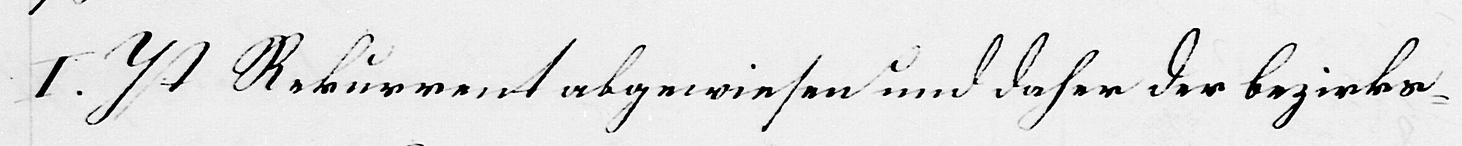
I. Ist Rekurrent abgewiesen und daher der bezirks¬
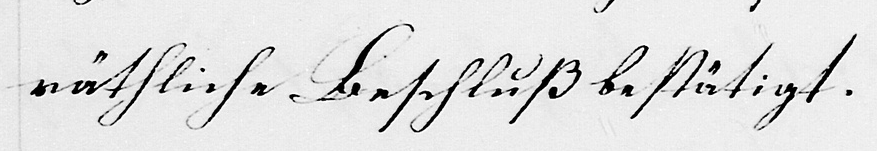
räthliche Beschluß bestätigt.
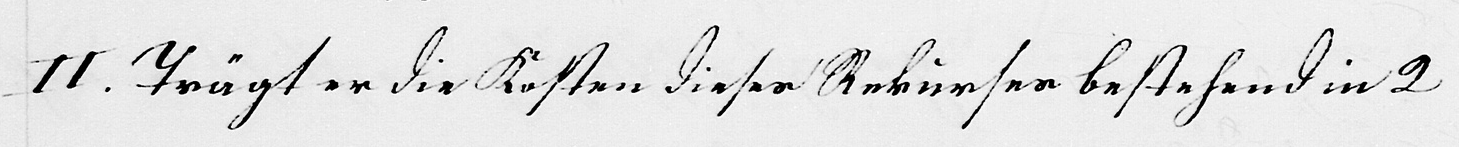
II. Trägt er die Kosten dieses Rekurses bestehend in 2
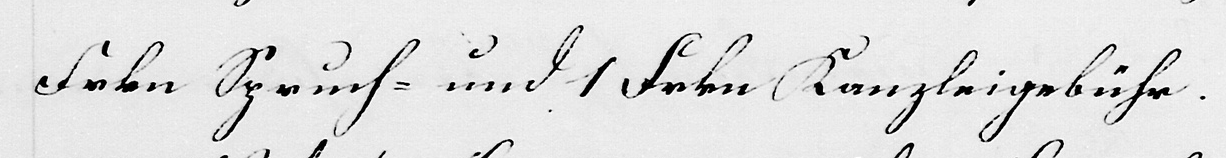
Frkn Spruch- und 1 Frkn Kanzleigebühr.
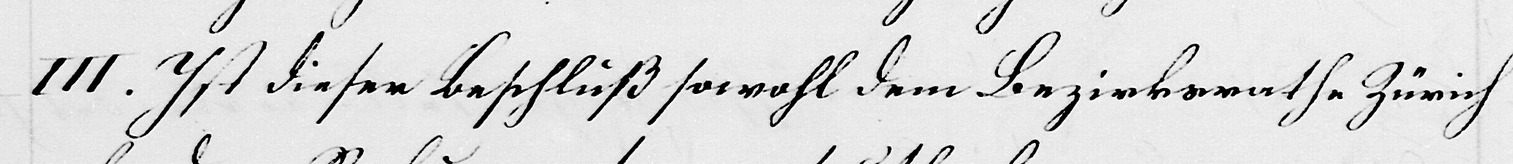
III. Ist dieser Beschluß sowohl dem Bezirksrathe Zürich
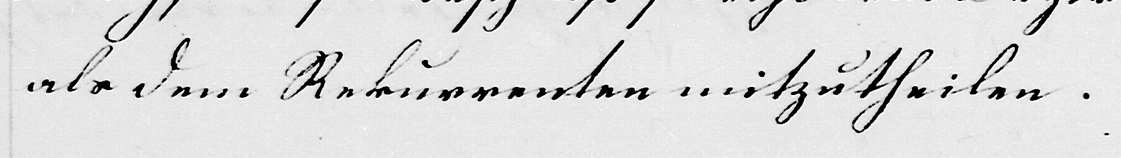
als dem Rekurrenten mitzutheilen.
